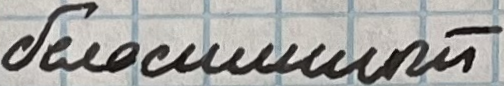белоспинный
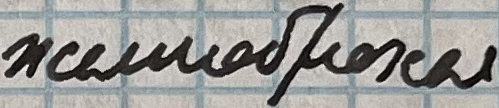желтобрюхая
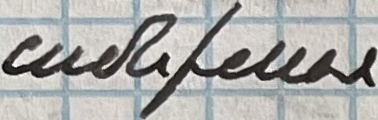сибирская
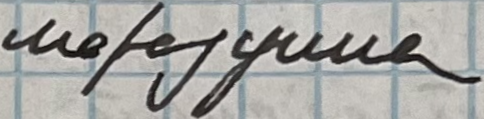мородунка
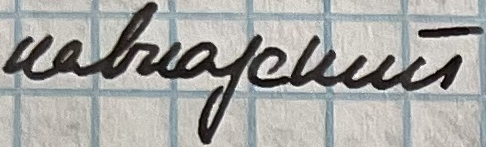кавказский
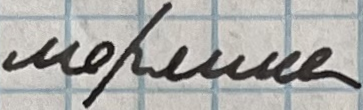морянка
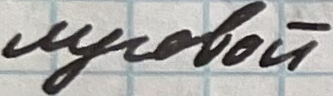луговой
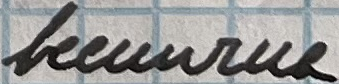весничка
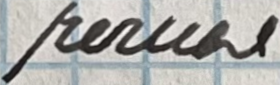речная
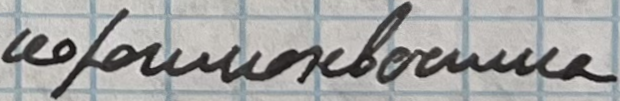короткохвостка
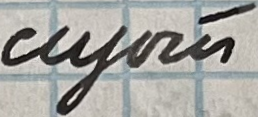сизый
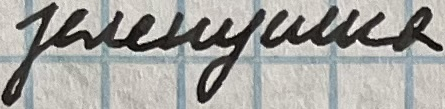зеленушка
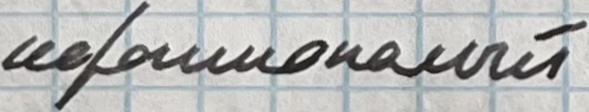короткопалый
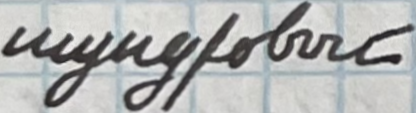тундровый
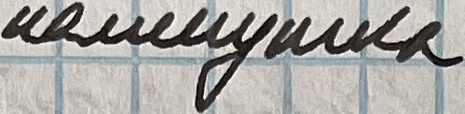каменушка
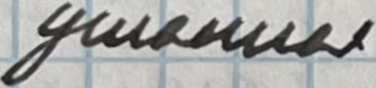ушастая
